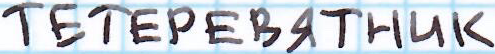тетеревятник
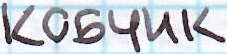кобчик
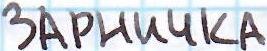зарничка
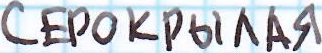серокрылая
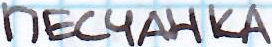песчанка
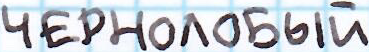чернолобый
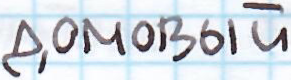домовый
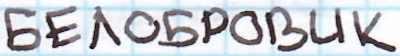белобровик
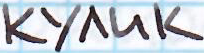кулик
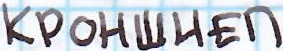кроншнеп
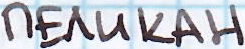пеликан
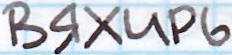вяхирь
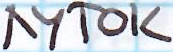луток
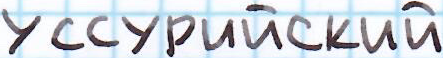уссурийский
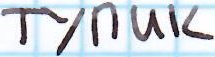тупик
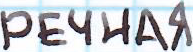речная
